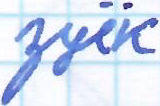зуёк
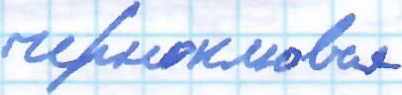черноклювая
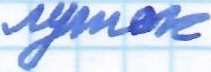луток
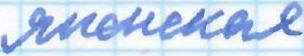японская
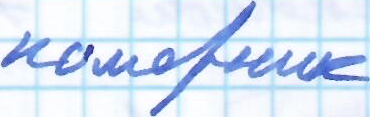поморник
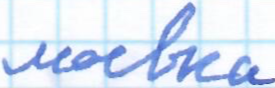моевка
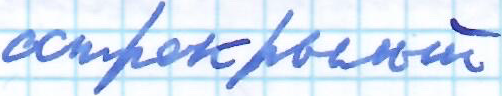острокрылый
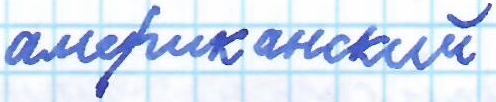американский
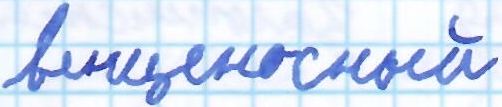венценосный
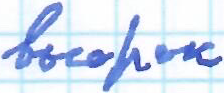вьюрок
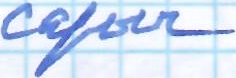сарыч
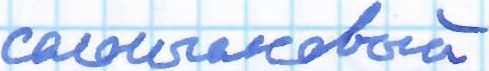солончаковый
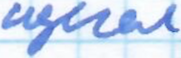щегол
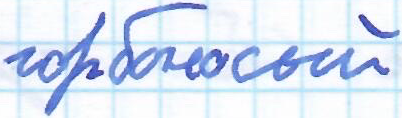горбоносый
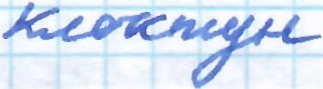клоктун
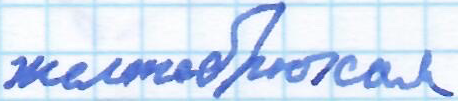желтобрюхая
